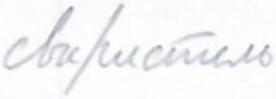свиристель
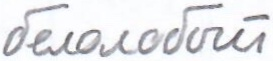белолобый
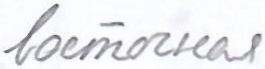восточная
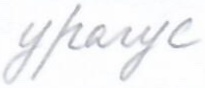урагус
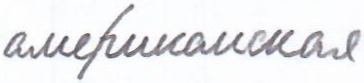американская
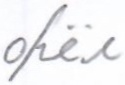орёл
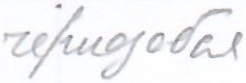чернозобая
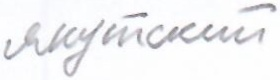якутский
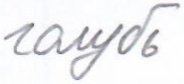голубь
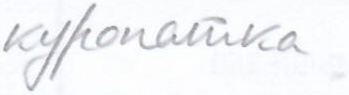куропатка
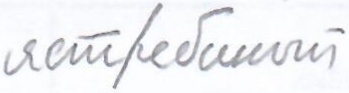ястребиный
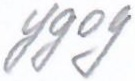удод
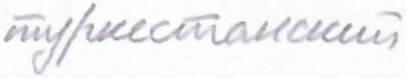туркестанский
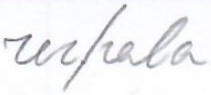чеграва
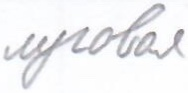луговая
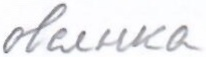овсянка
